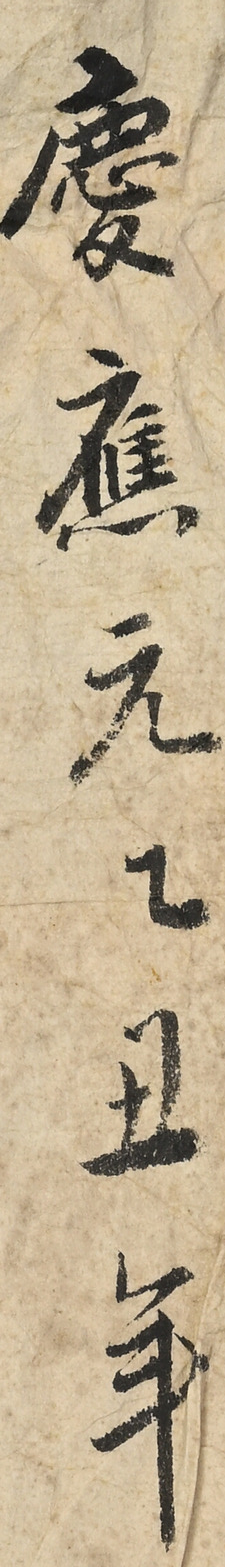慶応元乙丑年
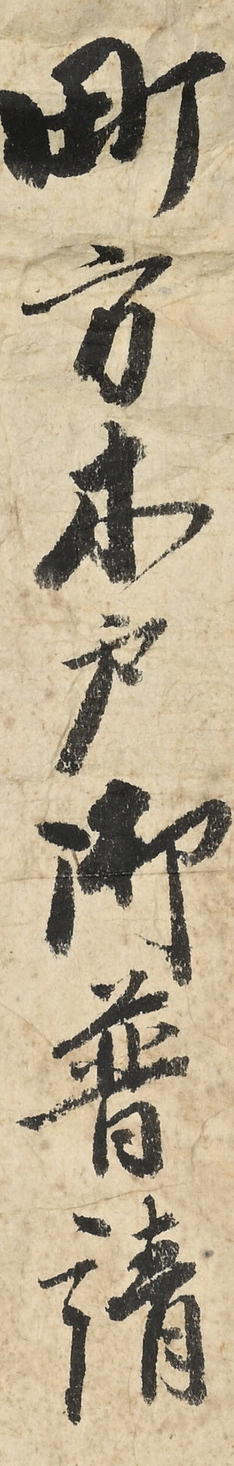町方木戸御普請
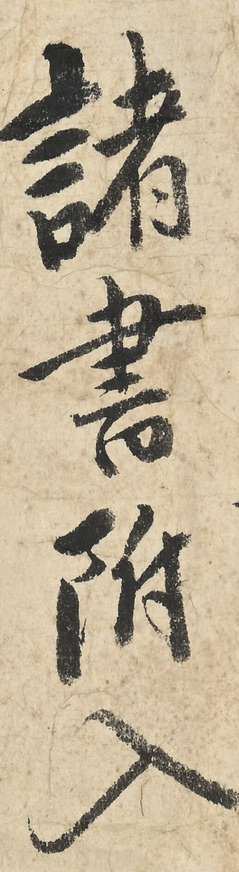諸書附入
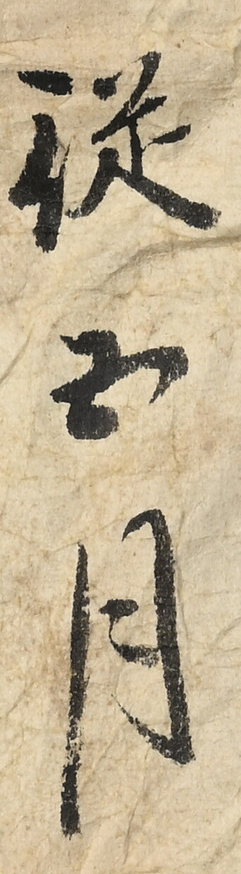従五月

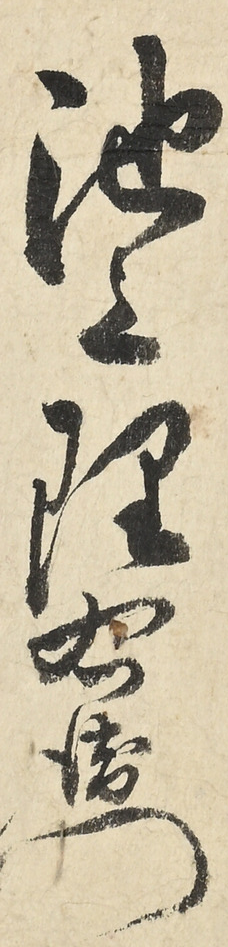池上理右衛門
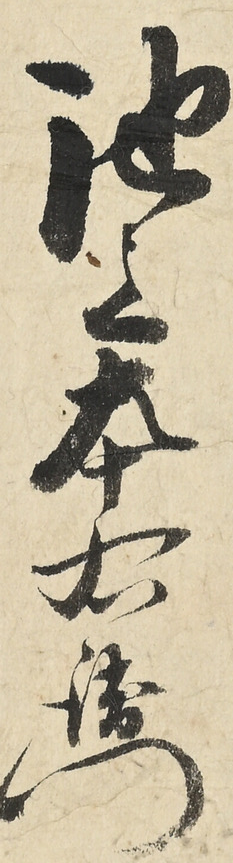池上本右衛門
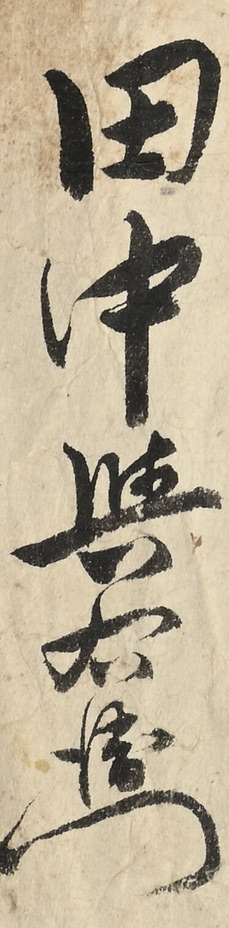田中与右衛門

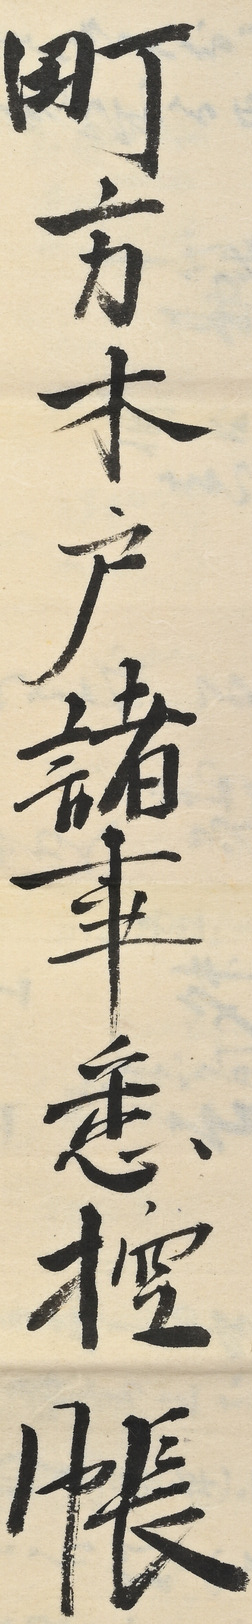町方木戸諸事悉控帳
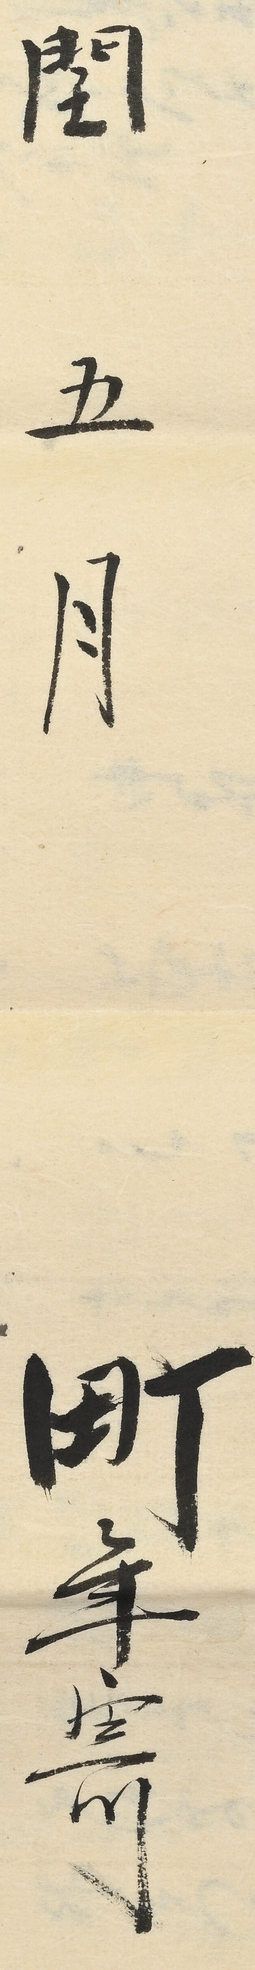閏五月町年寄

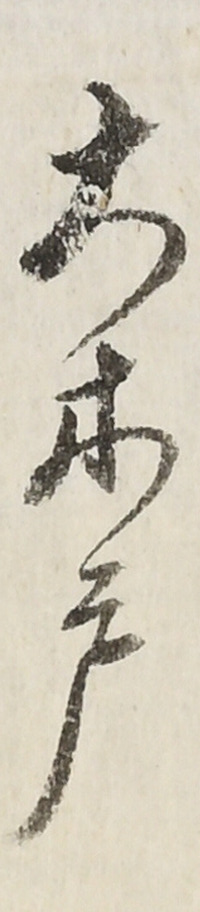大木戸
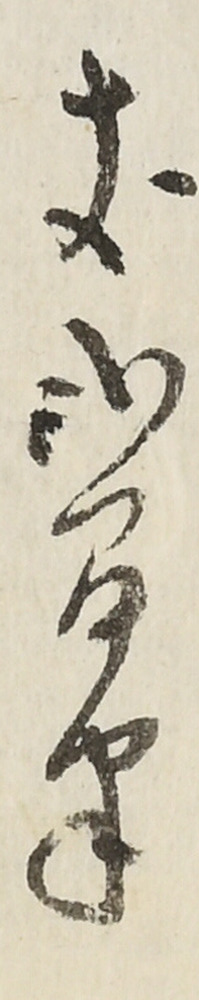丈弐間半
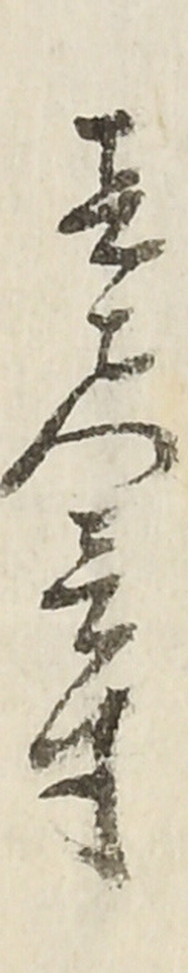壱尺三寸
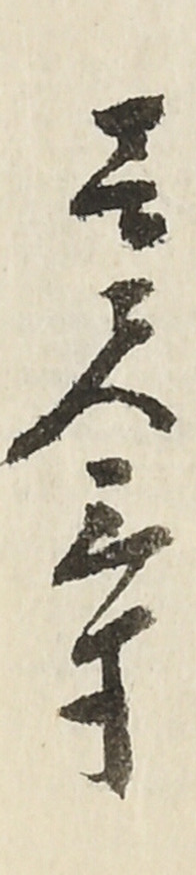壱尺三寸
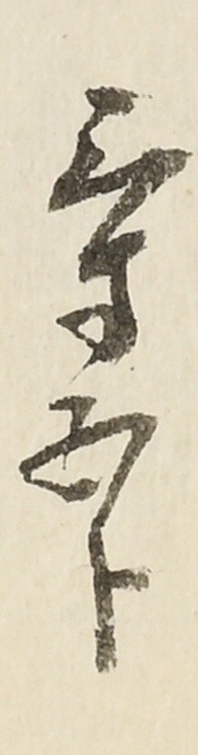三寸五分
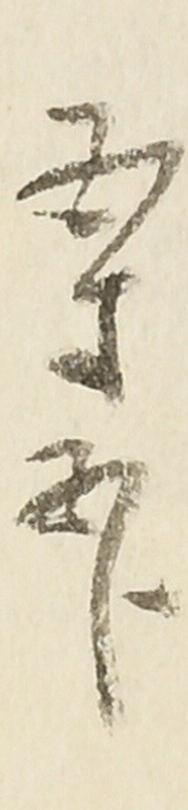五寸五分
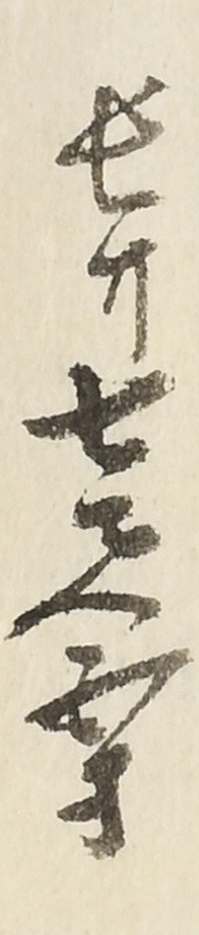長サ七尺五寸
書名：町方木戸御普請諸事附（一括）
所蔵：伊那市立高遠町図書館・合同会社AMANE
